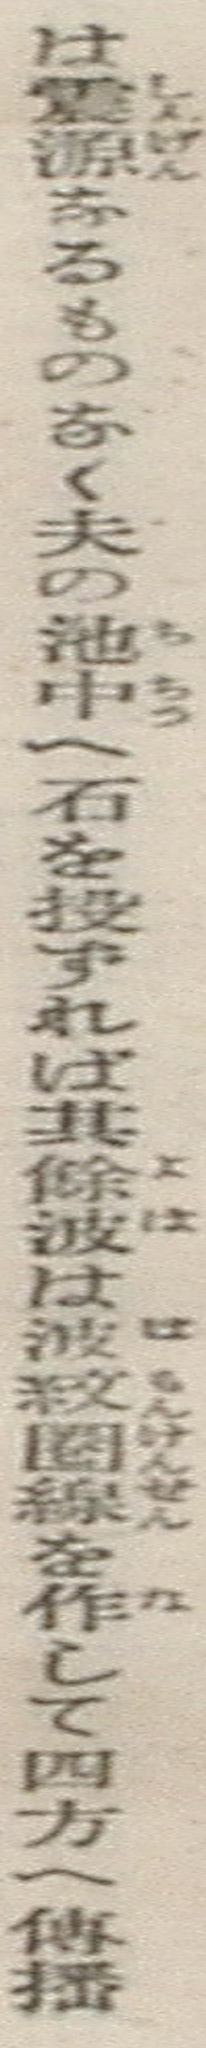は震源なるものなく夫の池中へ石を投ずれば其餘波は波紋圏線を作して四方へ傳播
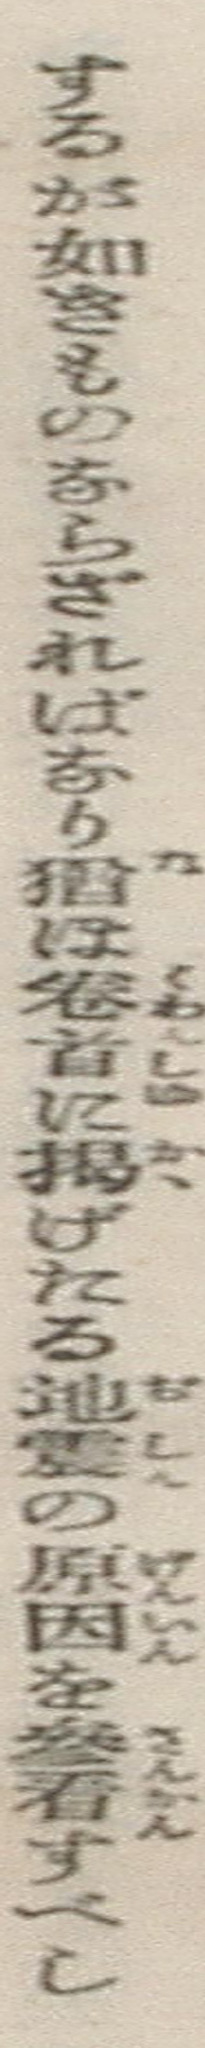するが如きものならざればなり猶ほ巻首に掲げたる地震の原因を参看すべし
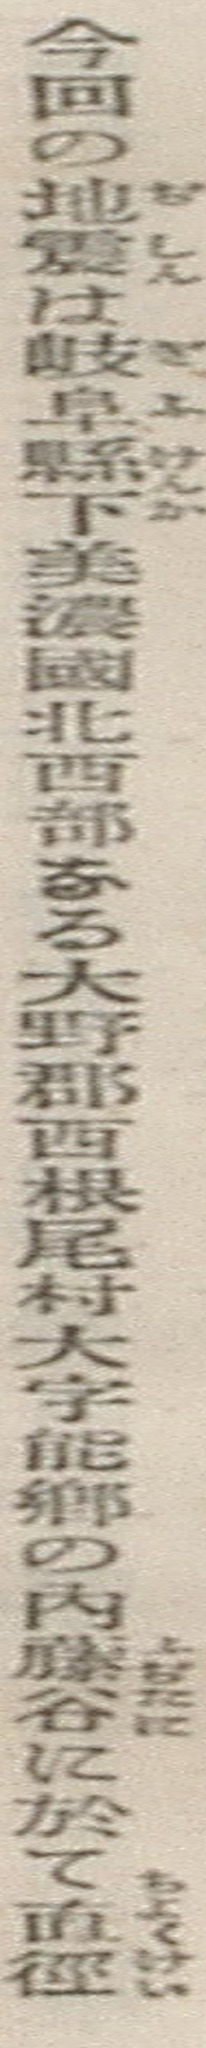今回の地震は岐阜縣下美濃國北西部なる大野郡西尾根村大字能郷の内藤谷に於て直徑
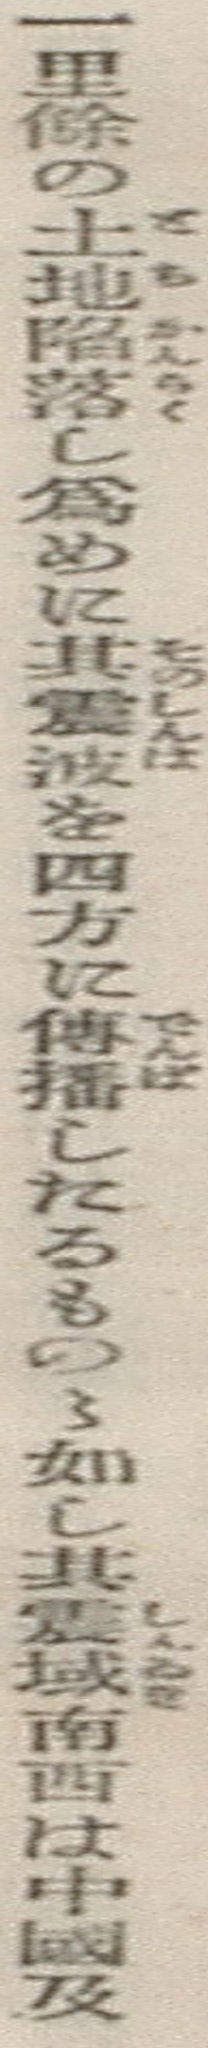一里餘の土地陥落し為めに其震波を四方に傳播したるもの〻如し其震域南西は中國及
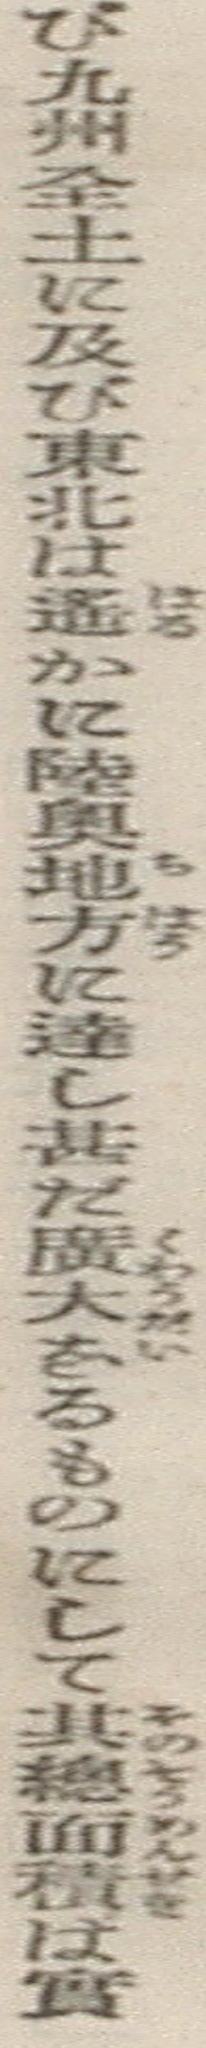び九州全土に及び東北は遥かに陸奥地方に達し甚だ廣大なるものにして其総面積は實
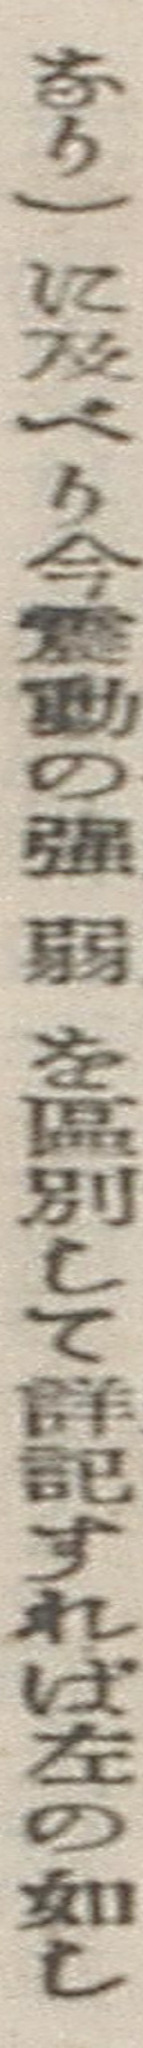なり）に及べり今震動の強弱を區別して詳記すれば左の如し
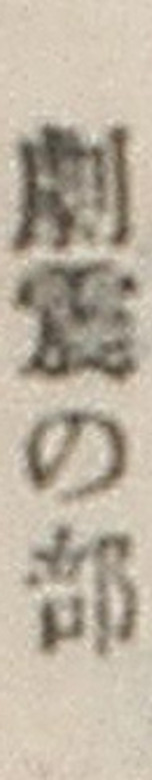劇震の部
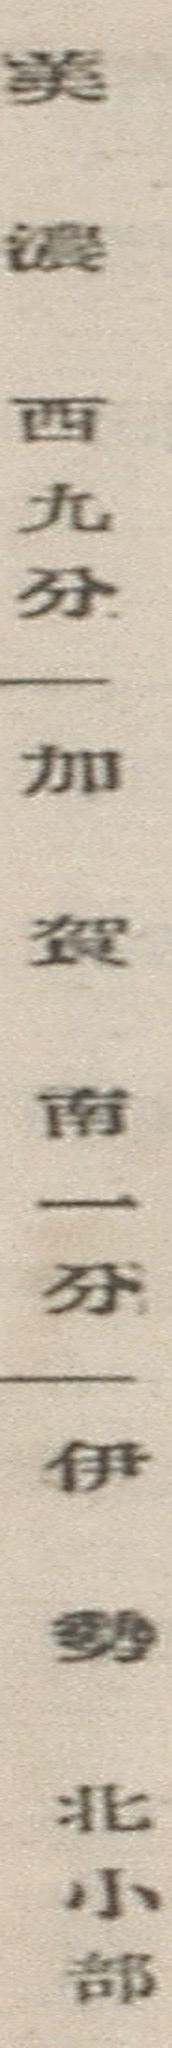美濃西九分加賀南一分伊勢北小部
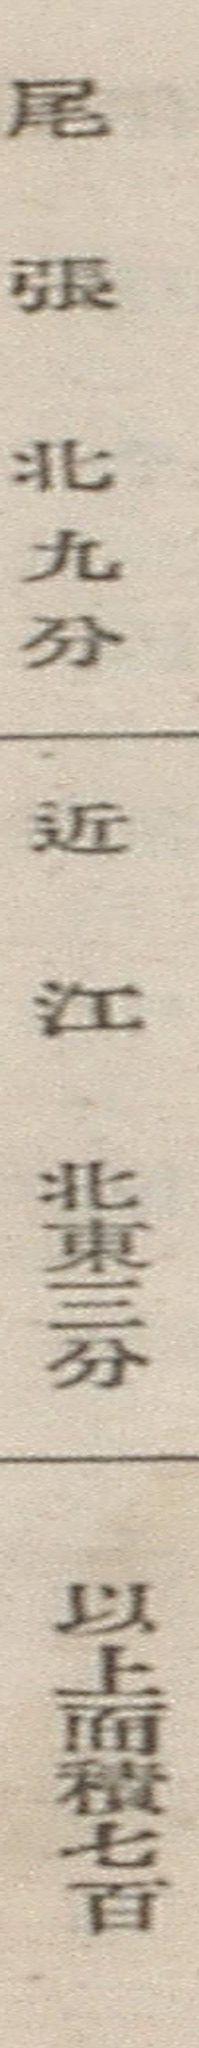尾張北九分近江北東三分以上面積七百
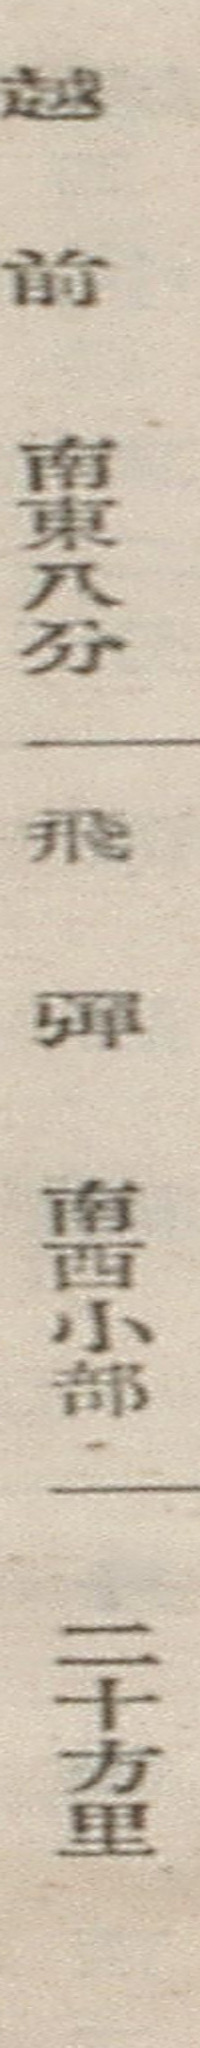越前南東八分飛騨南西小部二十方里
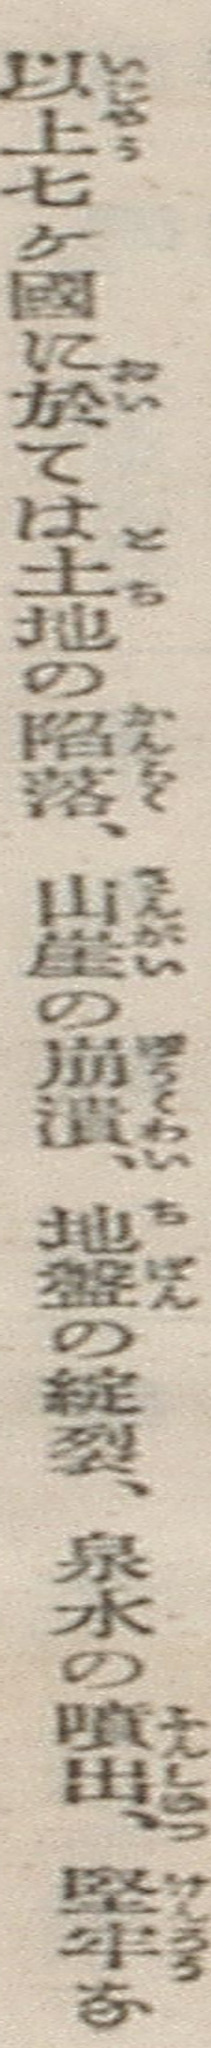以上七ヶ國に於ては土地の陥落、山崖の崩潰、地盤の綻裂、泉水の噴出、堅牢な
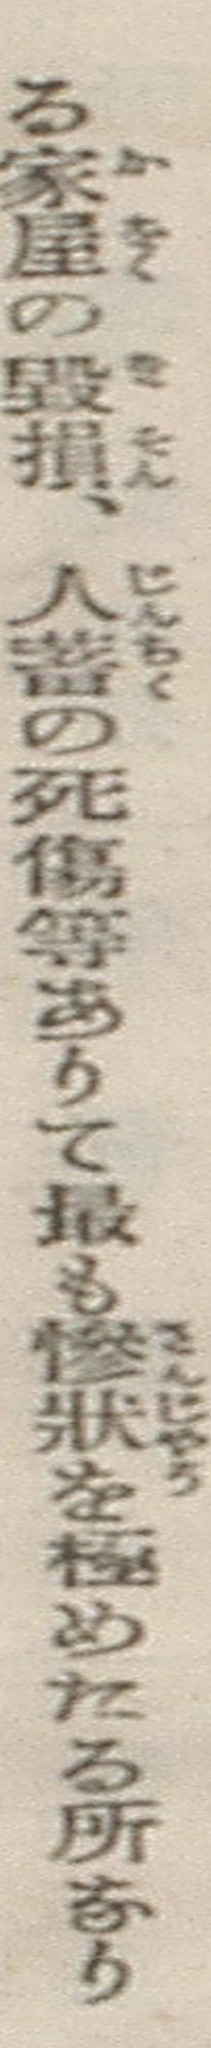る家屋の毀損、人畜の死傷等ありて最も惨状を極めたる所なり
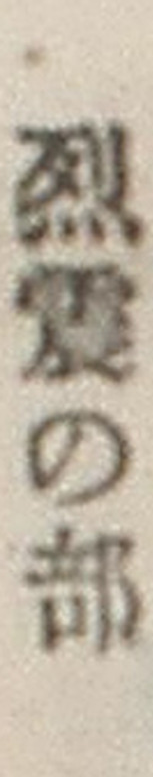烈震の部
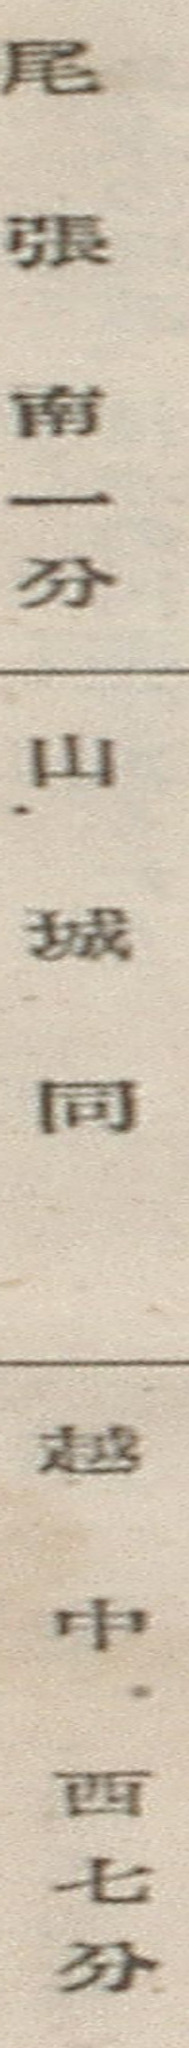尾張南一分山城同越中西七分
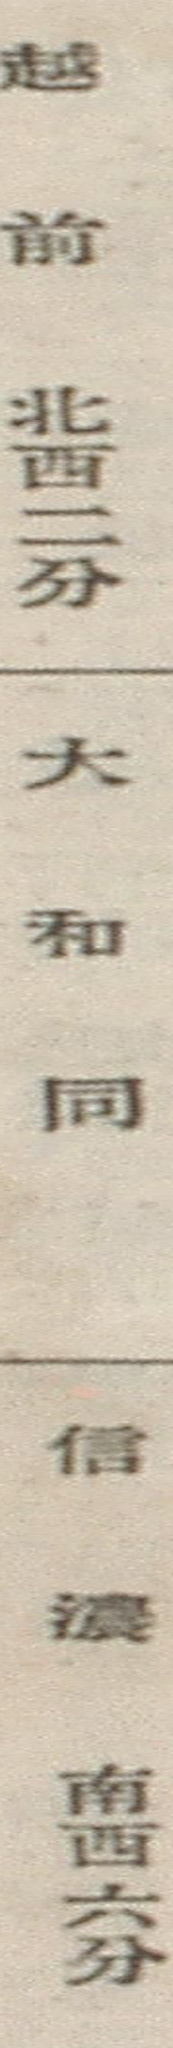越前北西二分大和同信濃南西六分
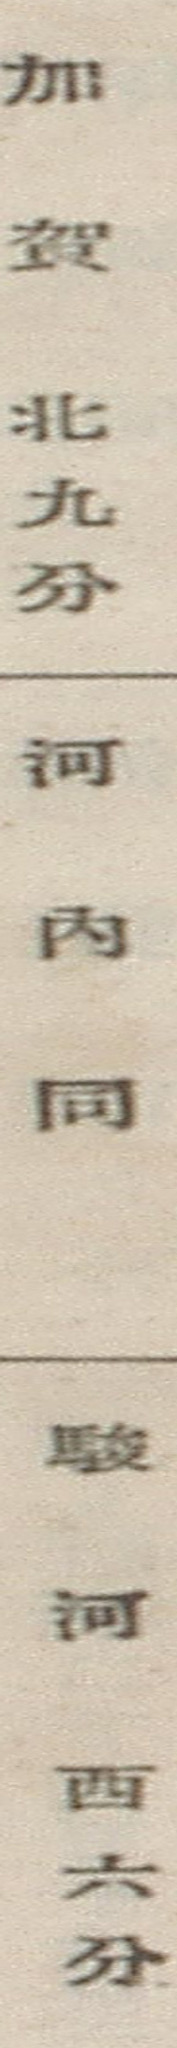加賀北九分河内同駿河西六分
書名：愛知岐阜福井三県　大地震見聞録（内題）
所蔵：東京大学地震研究所図書室 Earthquake Research Institute Library, The University of Tokyo, JAPAN
